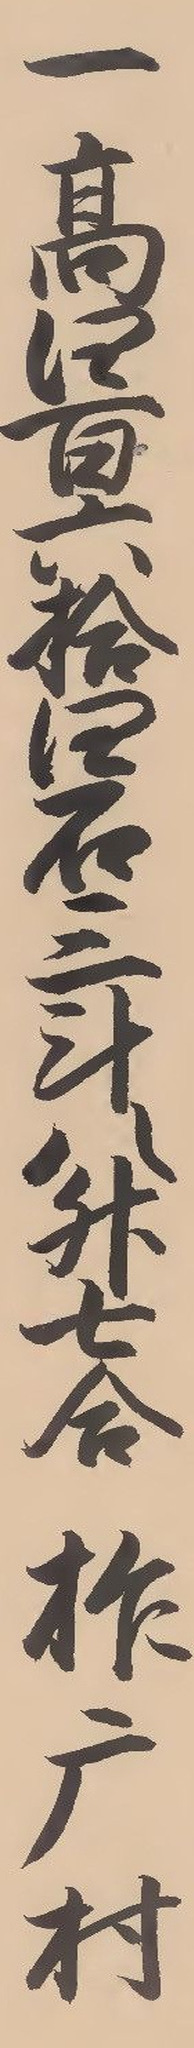一高四百六拾四石三斗八升七合柞磨村
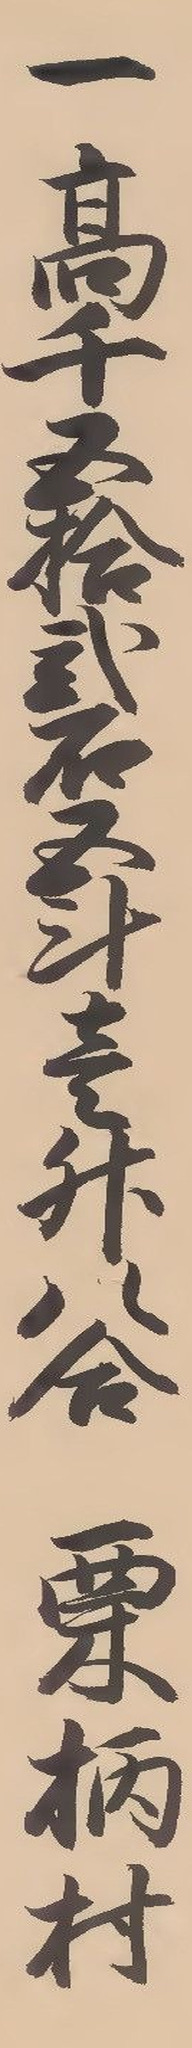一高千五拾弐石五斗壱升八合栗柄村
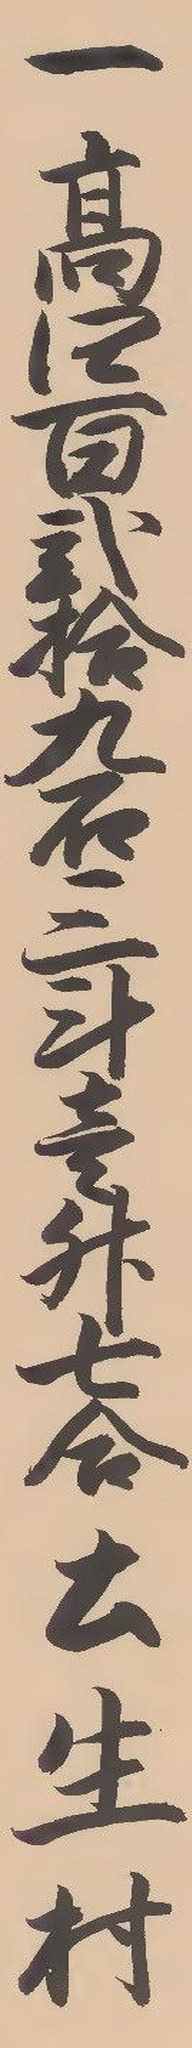一高四百弐拾九石三斗壱升七合土生村

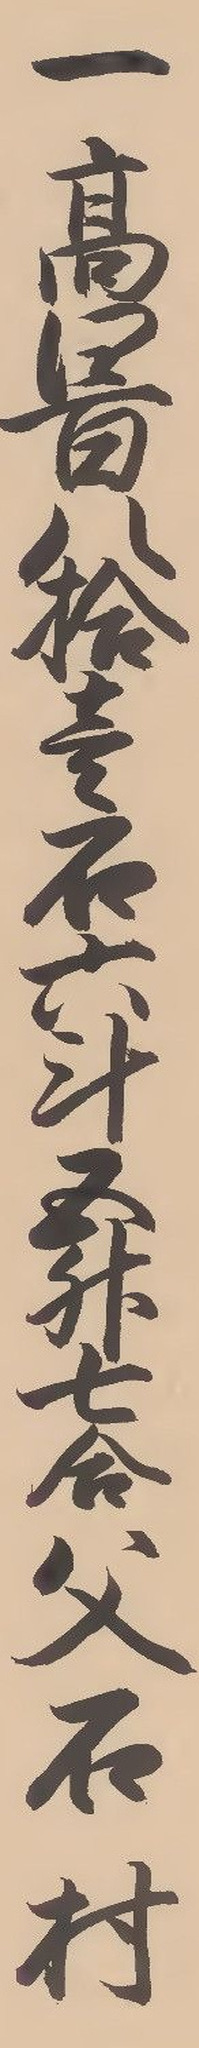一高四百八拾壱石六斗五升七合父石村
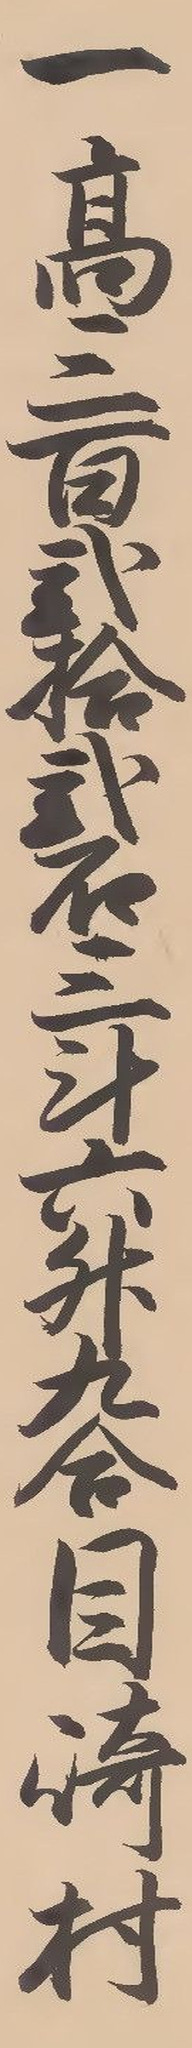一高三百弐拾弐石三斗六升九合目崎村
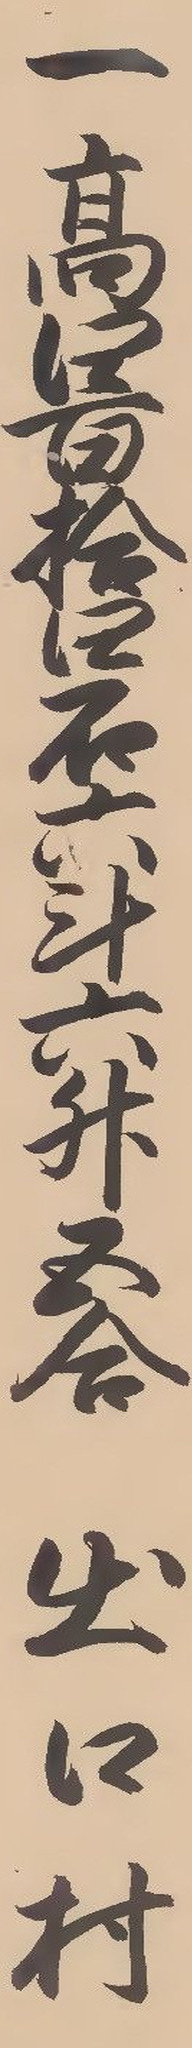一高四百拾四石六斗六升五合出口村
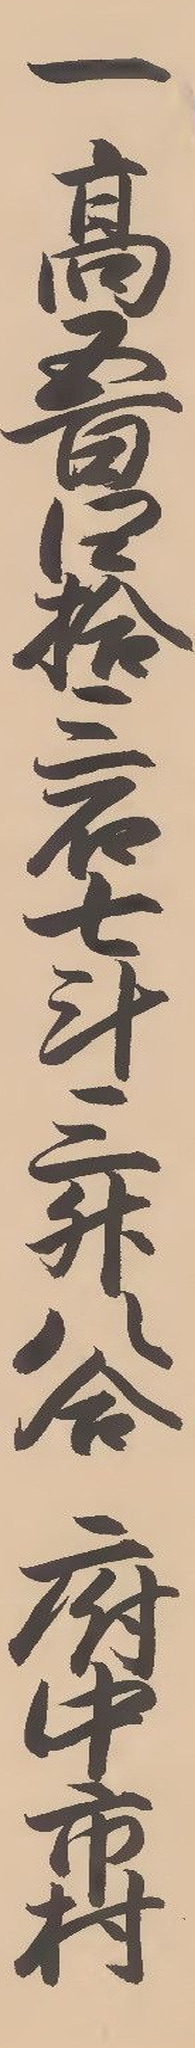一高五百四拾三石七斗三升八合府中市村
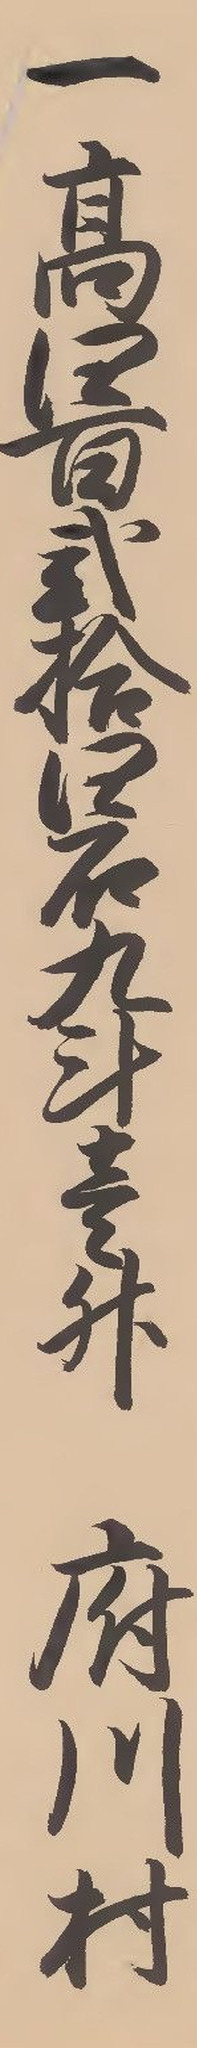一高四百弐拾四石九斗壱升府川村
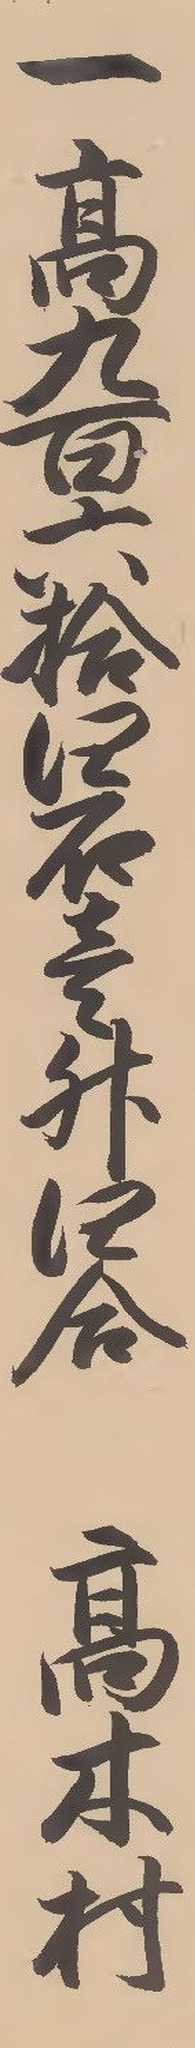一高九百六拾四石壱升四合高木村
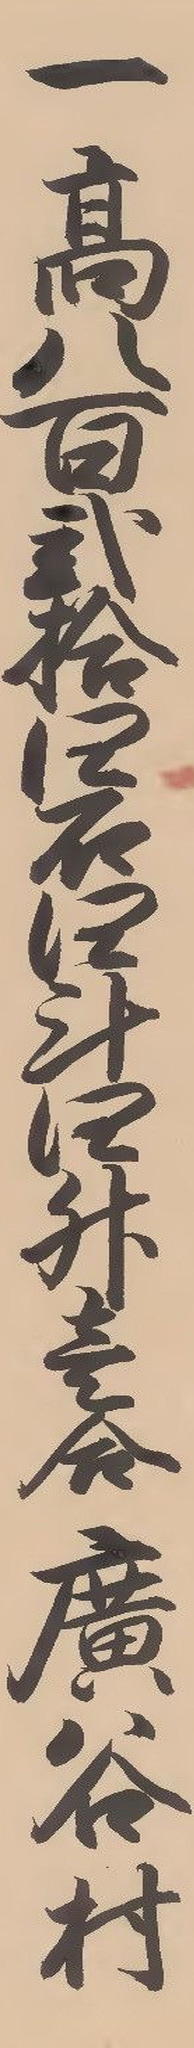一高八百弐拾四石四斗四升壱合広谷村
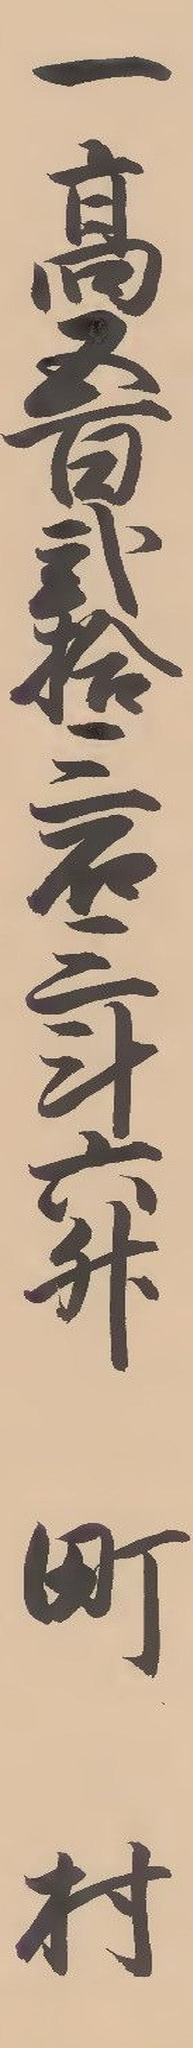一高五百弐拾三石三斗六升町村

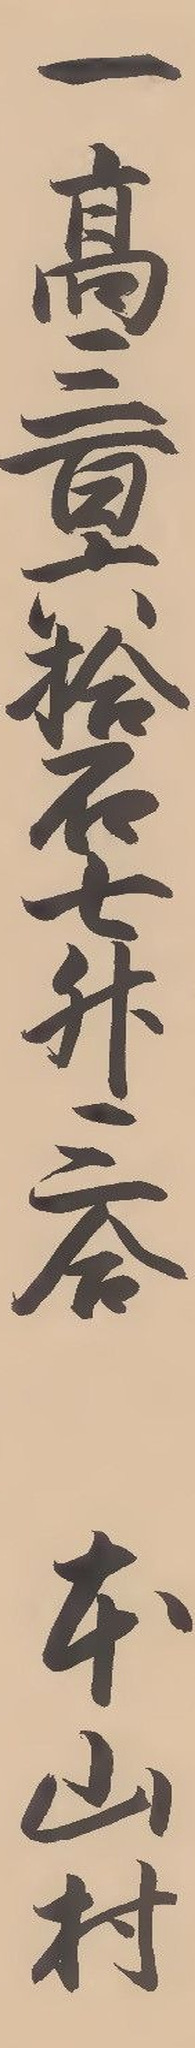一高三百六拾石七升三合本山村
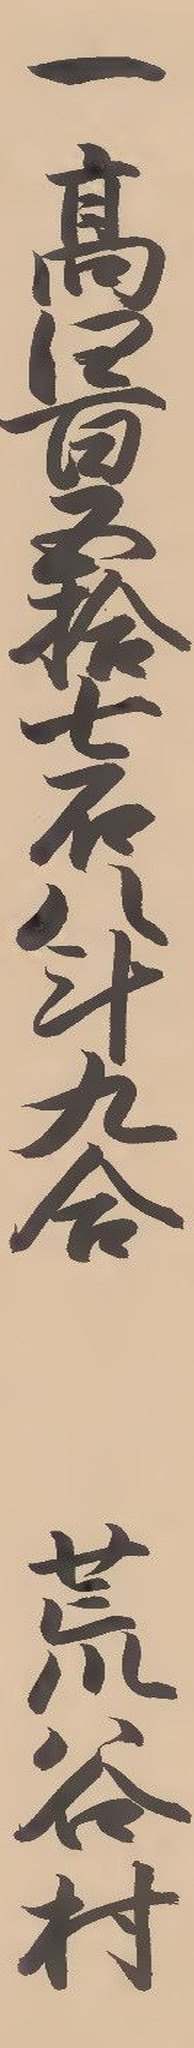一高四百五拾七石八斗九合荒谷村
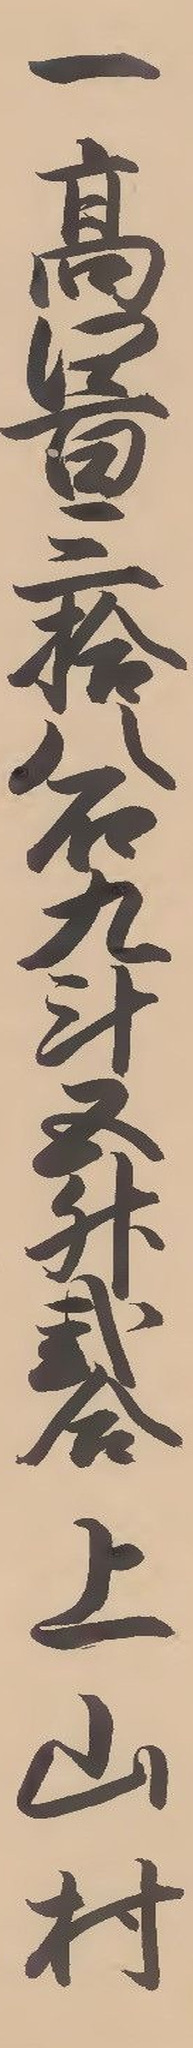一高四百三拾八石九斗五升弐合上山村
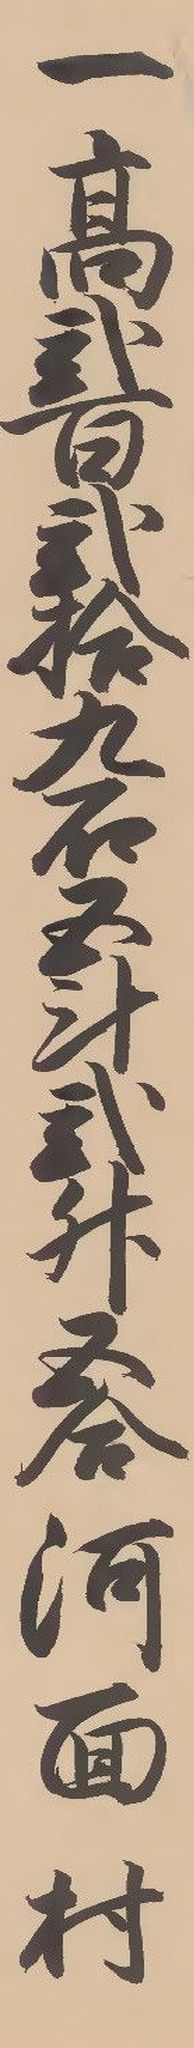一高弐百弐拾九石五斗弐升五合河面村
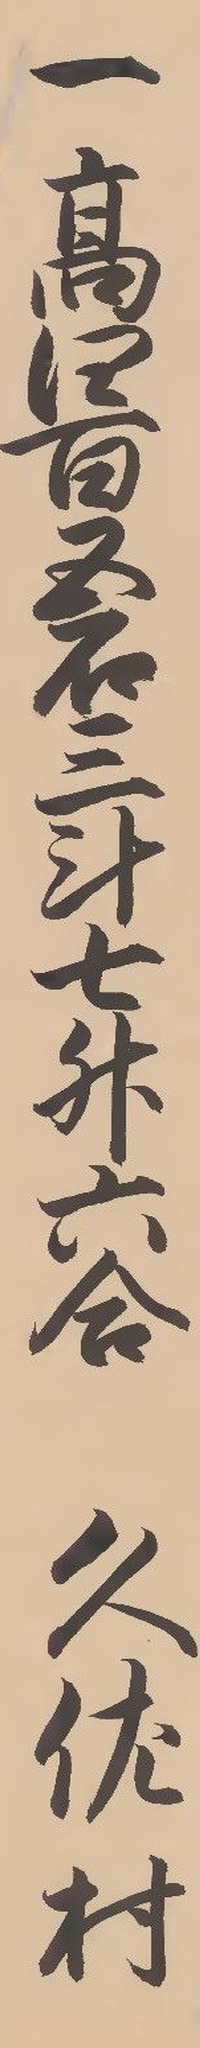一高四百五石三斗七升六合久佐村
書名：備後国郷帳
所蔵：国立公文書館 National Archives of Japan
